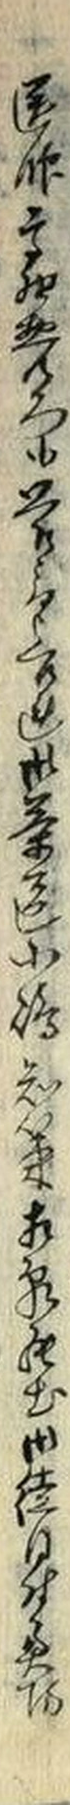医師高野惣左衛門も思召ニ而被召連御茶道小嶋知策相願罷出御徒目付奥坊
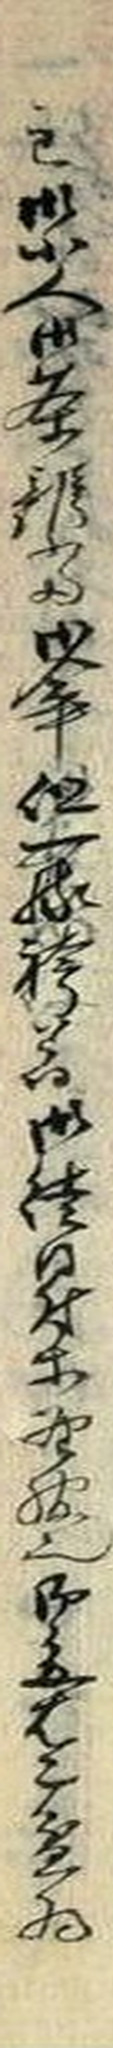主御小人御茶弁当御傘但一統袴着御徒目付等野服也御たはこ盆為

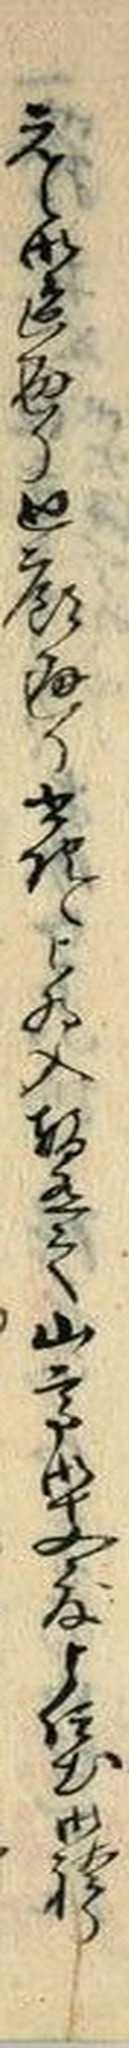元之御道通り廻廊通り書院へ被為入暫有之山亭御支度被仰出御袴
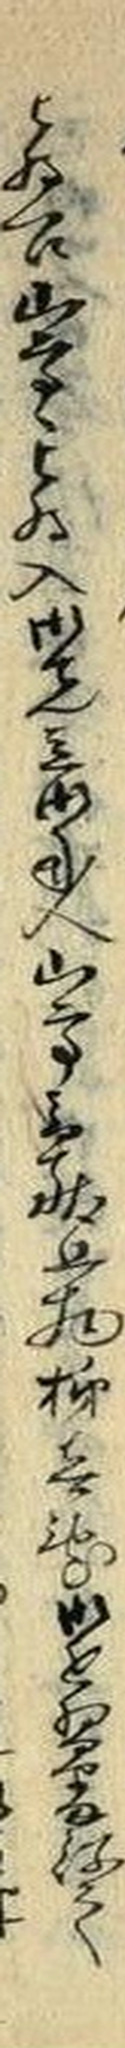被為召山亭へ被為入御先立御用人山亭ニ而献上物柿壱台御近習番役之
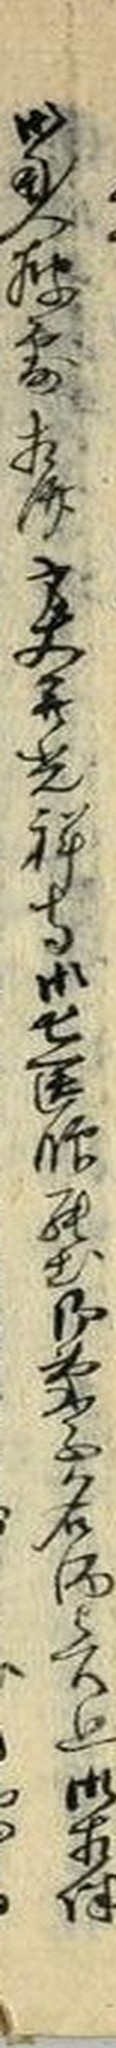御用人披露相済方丈幷光祥寺御匙医師罷出御菓子名酒被召上御相伴
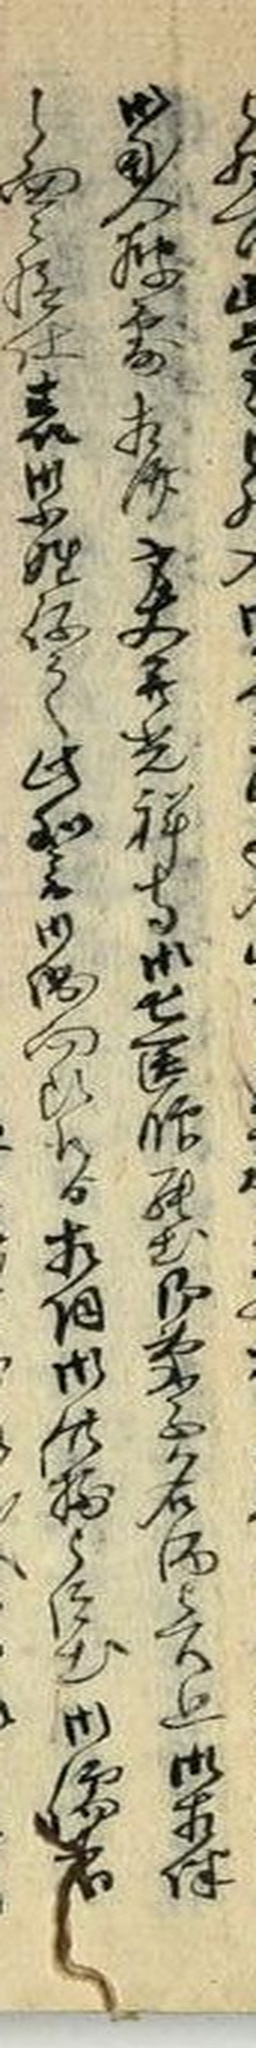之面々給仕表御小姓役之此処ニ而御側向頭取ゟ相伺御供揃被仰出御儒者
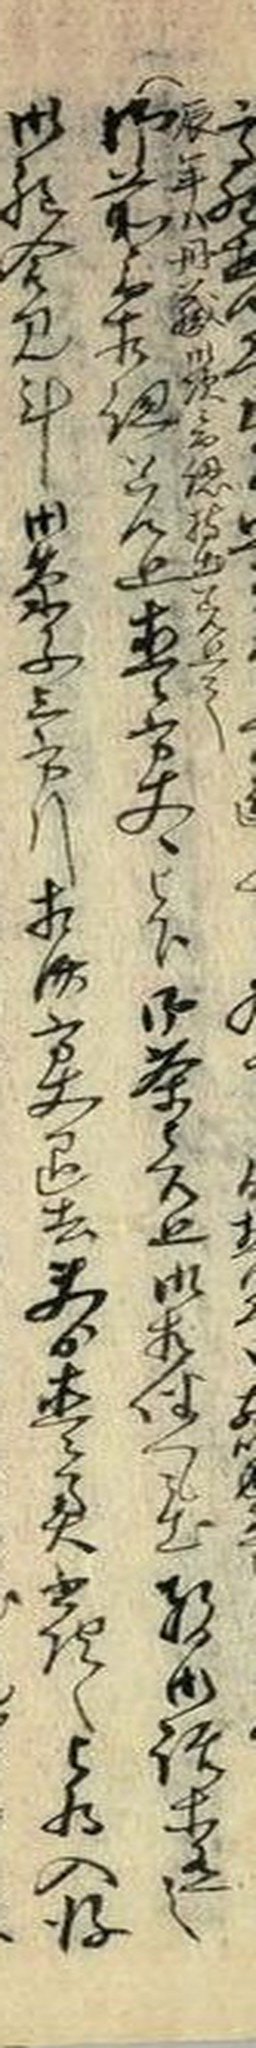御程合見計御菓子三方引相済方丈退去夫ゟ直ニ奥書院へ被為入後
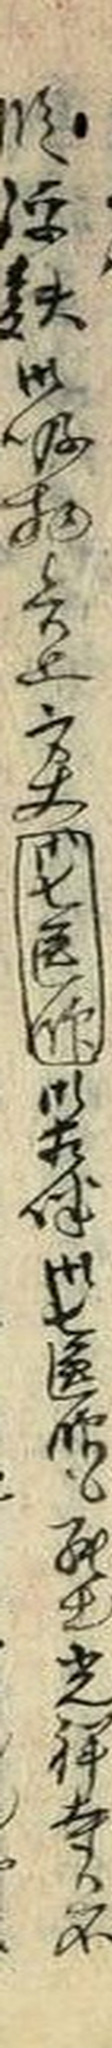段浮麸御吸物被召上方丈御匙医師御相伴御匙医師も罷出光祥寺ハ不
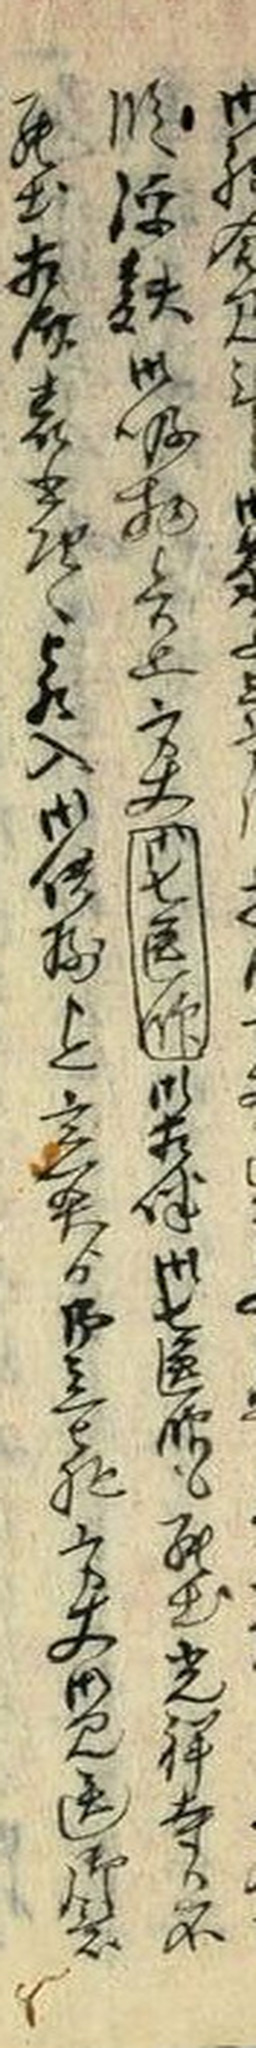罷出相済表書院へ被為入御供揃申上玄関ゟ御立被遊方丈御見送御意
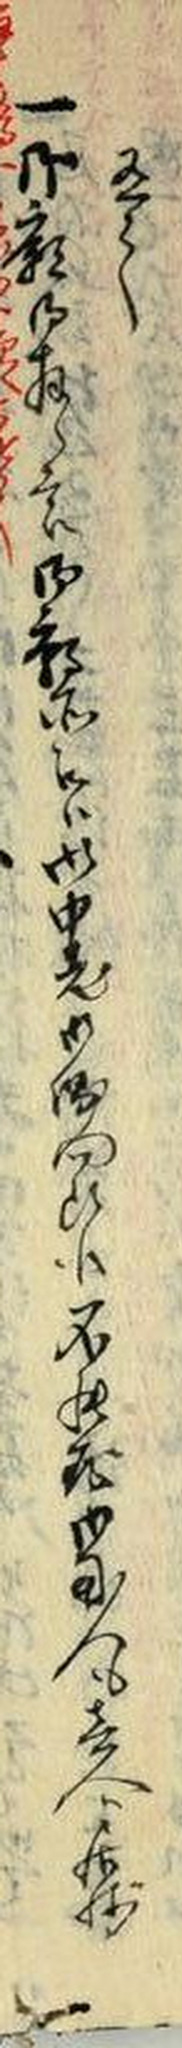一御廟御拝之節御廟所江ハ御中老御側向頭取不罷越御用人も壱人ハ居残
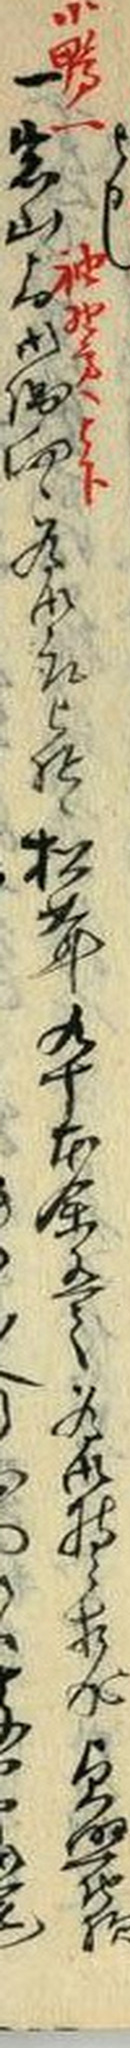一岩山ニ而御側向へ為御取被遊候松茸九十本余有之為御持ニ相成貞照院様
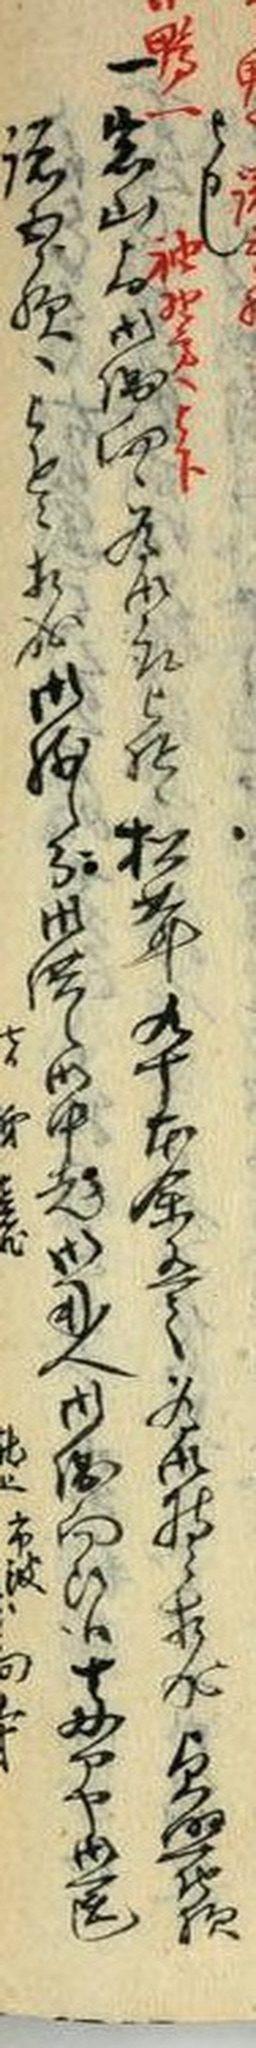謙五郎様へ被進ニ相成御残之分御供之御中老御用人御側向頭取江両部や御医
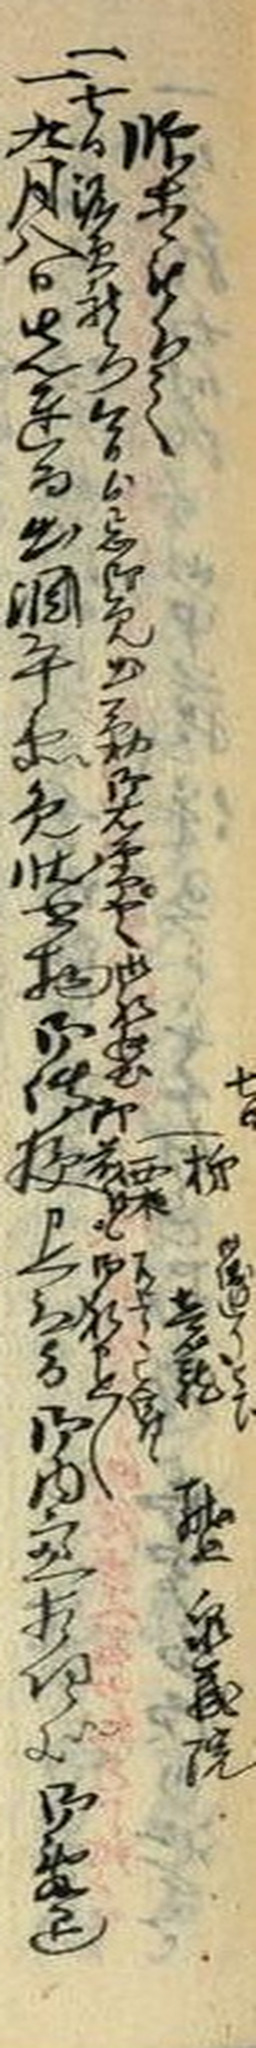一九月八日先達而出淵平兵衛免状書物御伝授申上度旨御内慮相伺候処御辞退
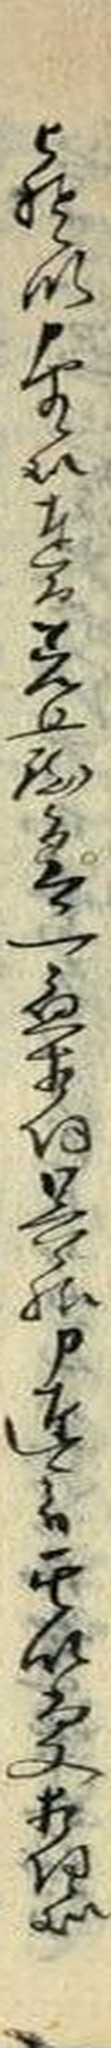被遊候段申聞候処達而差上度旨今一応相伺呉候様申達候ニ付其段尚又相伺候処
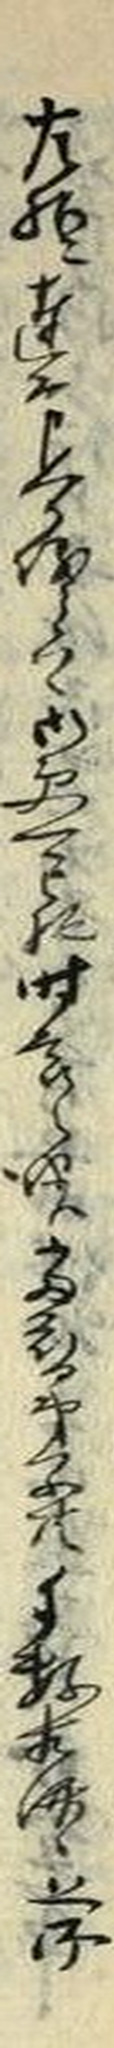左様ニ達而申上候儀ニ候ハヽ御受可被遊時節之儀ハ当暮弟子共手数相済候上御
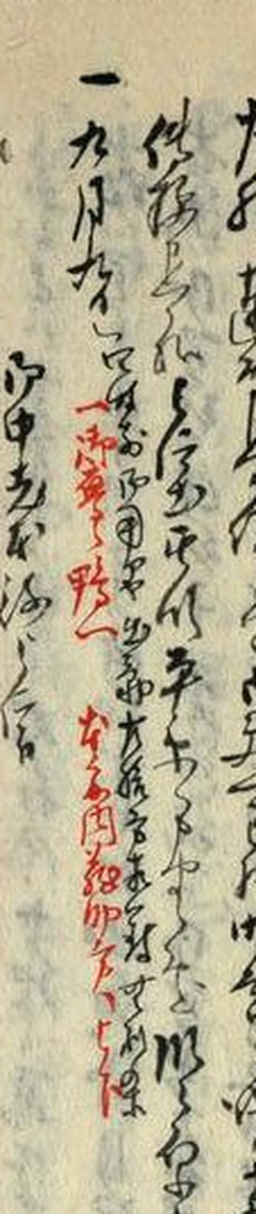一九月九日四時前御用部や出勤左膳方相対無別条
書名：少傅日録抄（斉承付側向頭取日記、在国）
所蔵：福井県文書館 Fukui Prefectural Archives
